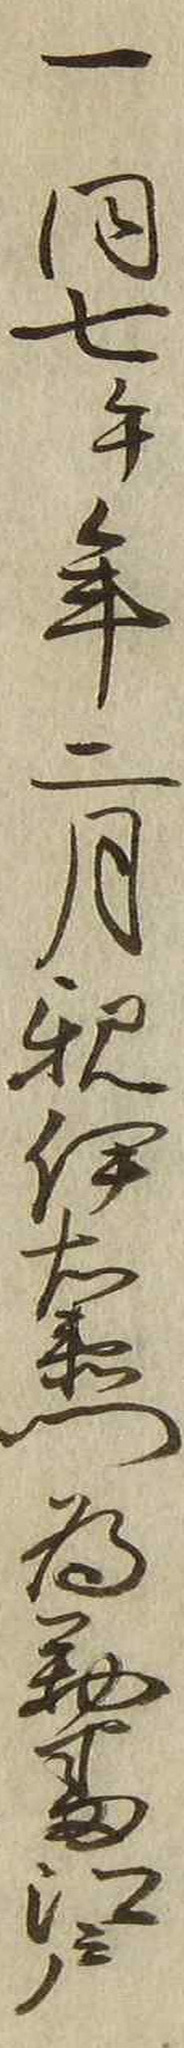一同七午年二月親伊右衛門為勤番江戸
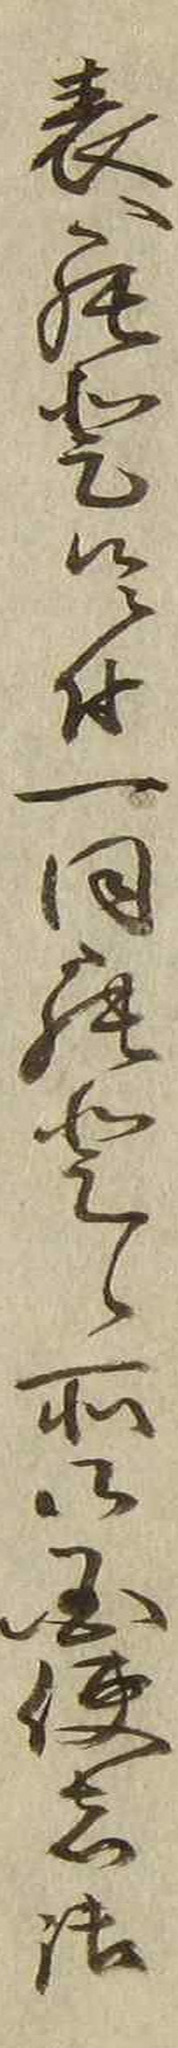表へ罷登候ニ付一同罷登候所御国使者御
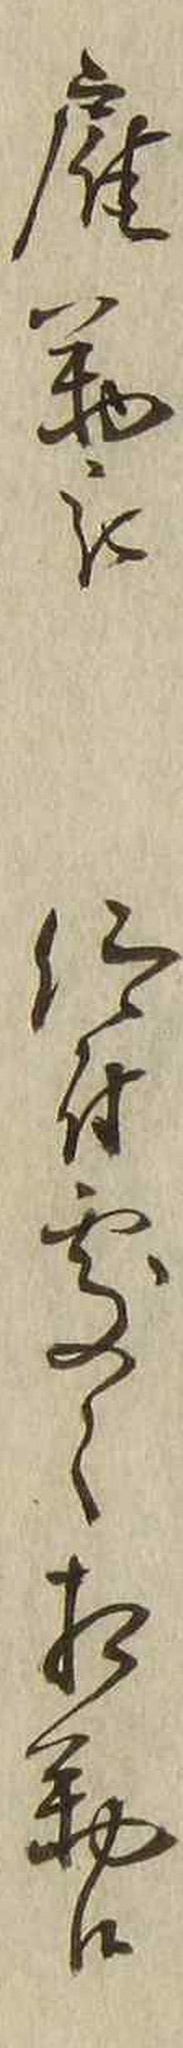雇勤被仰付処々相勤候

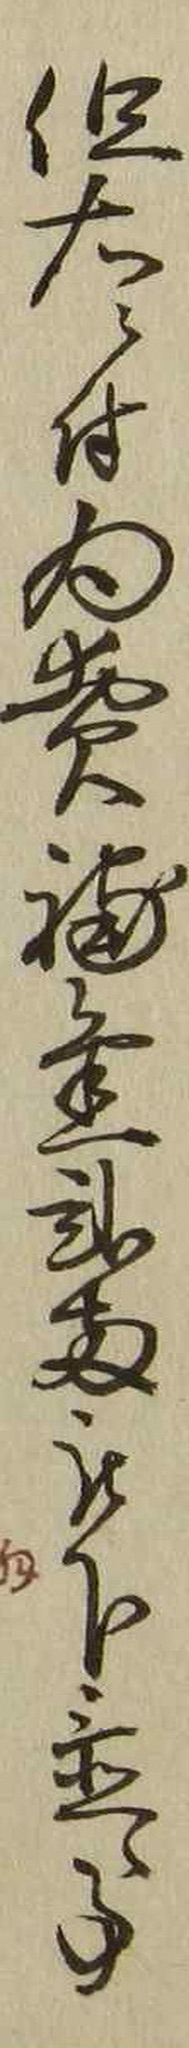但右ニ付為費補金弐両被下置候事
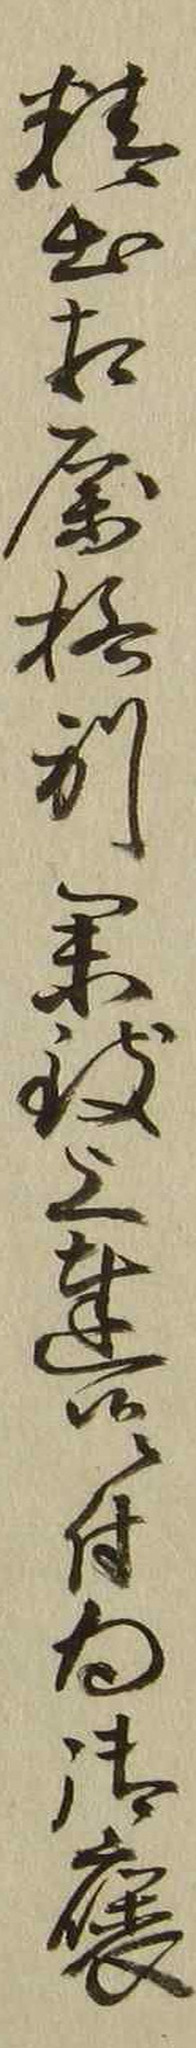精出相属格別果致上達候ニ付為御褒
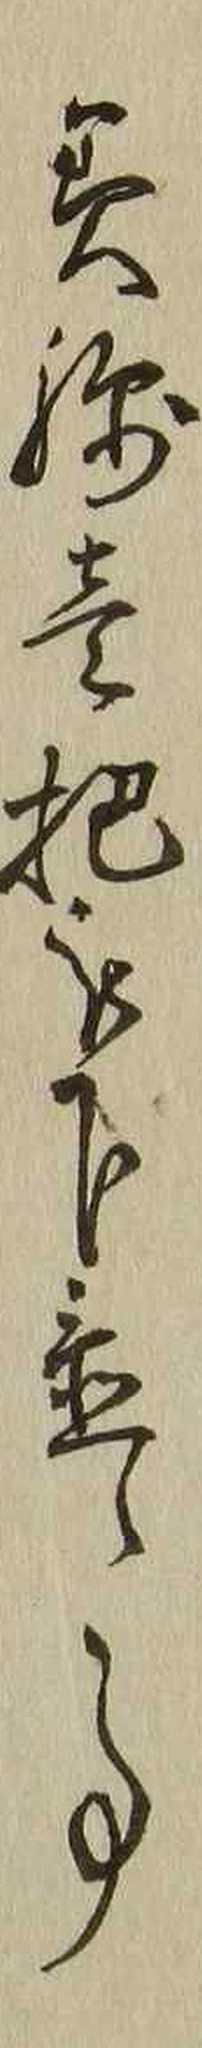美綿壱把被下置候事
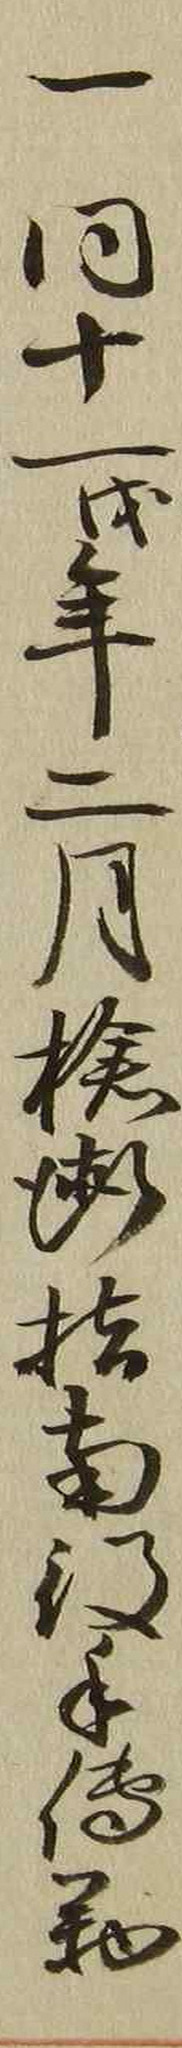一同十一戌年二月槍術指南役手伝勤
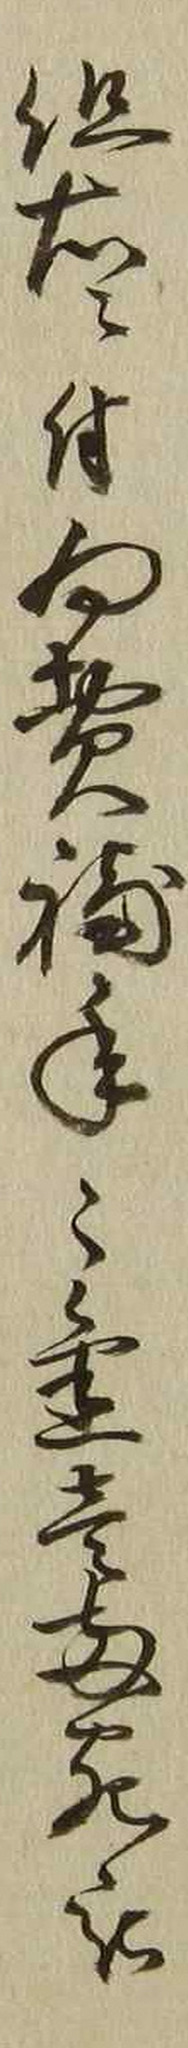但右ニ付為費補年々金壱両宛被
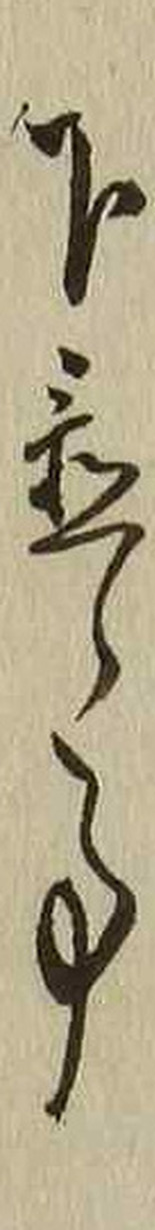下置候事
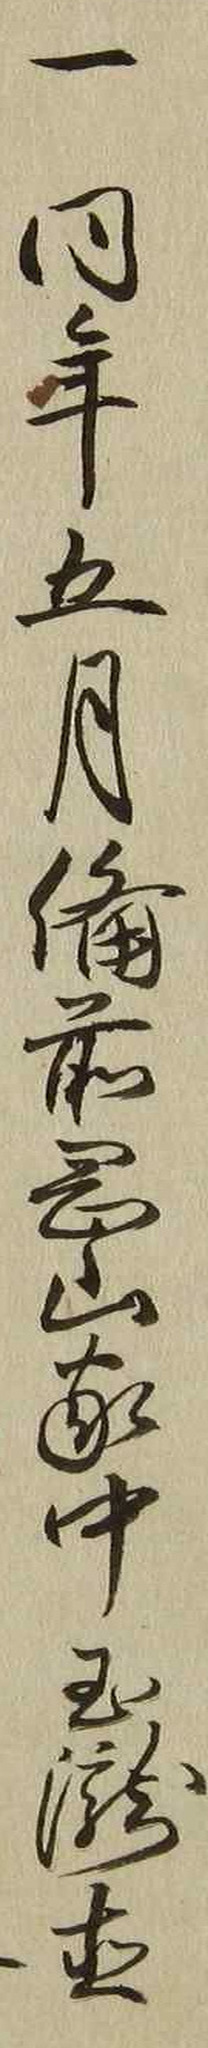一同年五月備前岡山家中玉瀧直
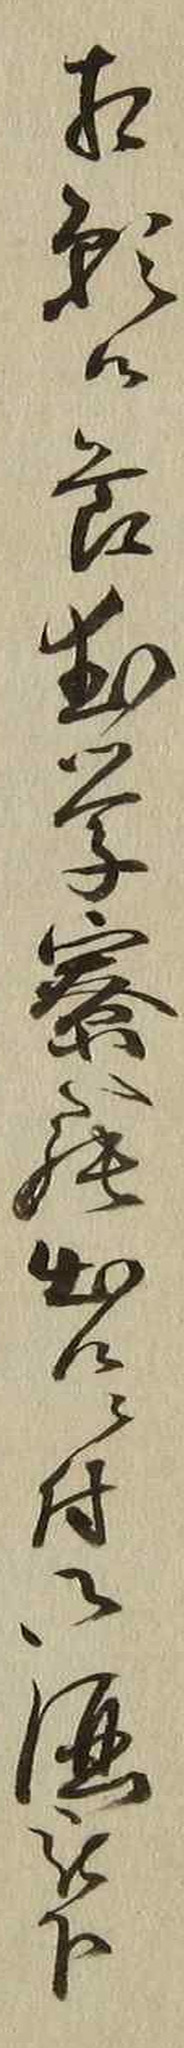相願候節武学寮へ罷出候ニ付御酒被下
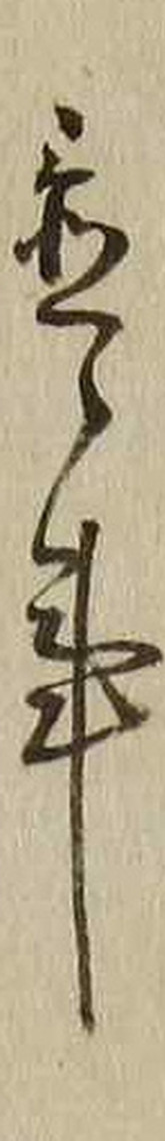置候事
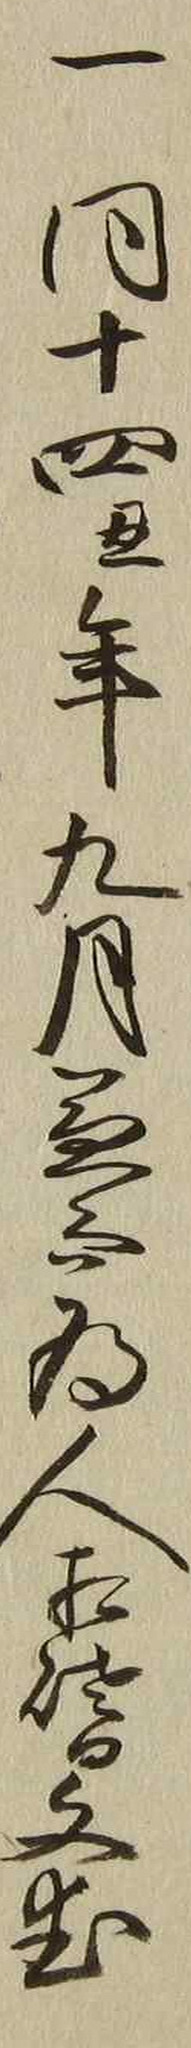一同十四丑年九月兼而為人相嗜文武
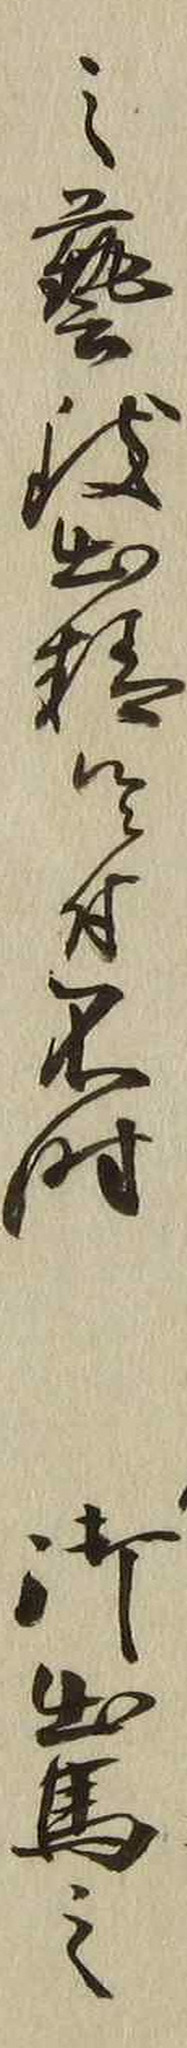之芸致出精候ニ付不時御出馬之
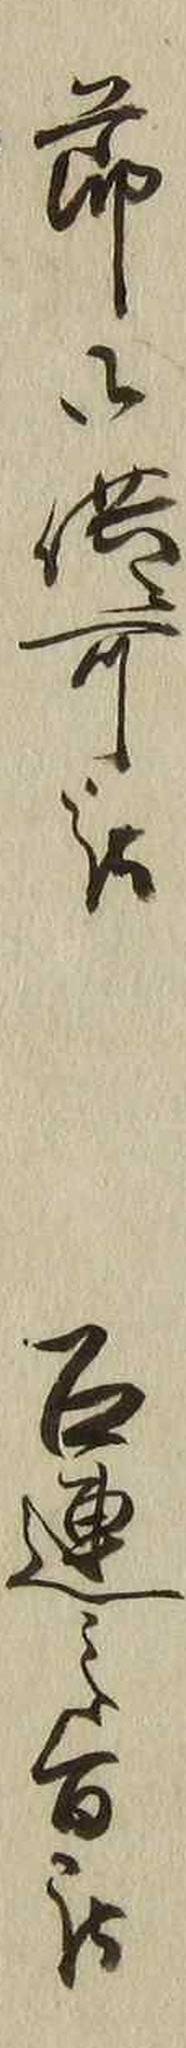節御供ニ可被召連之旨被
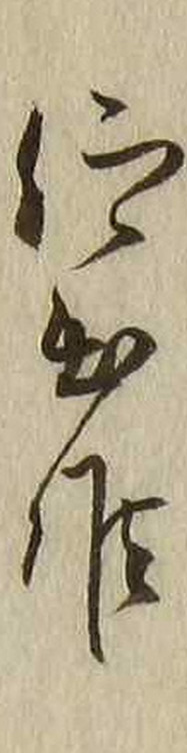仰出候
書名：諸士系譜　巻之60　と之部3
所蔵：会津若松市立会津図書館
